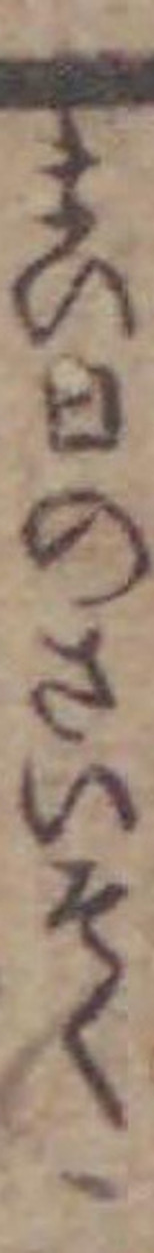毎日のさいそく
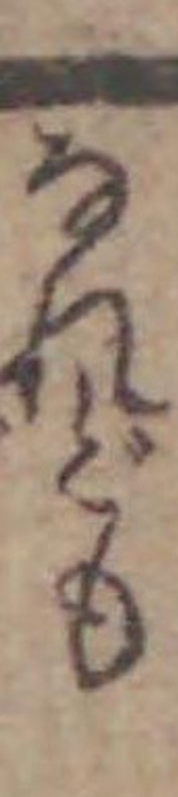なれども
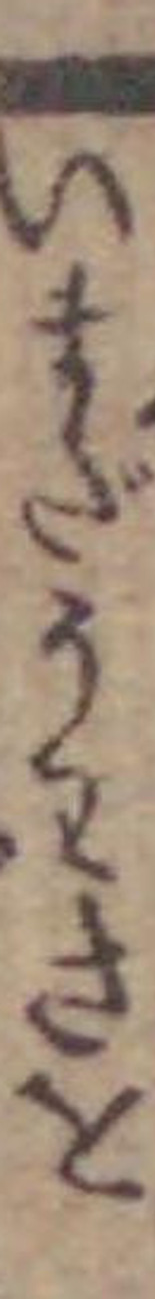いまだうわきを
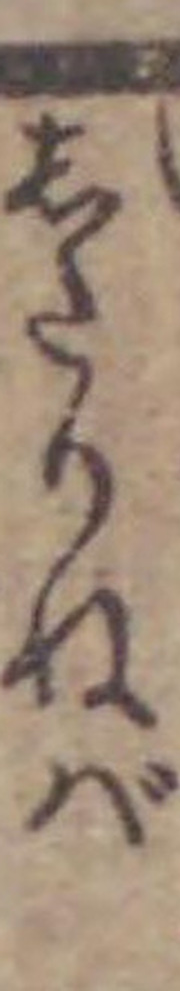したりねば
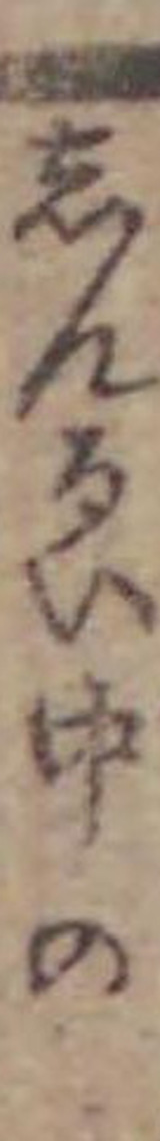しんるい中の
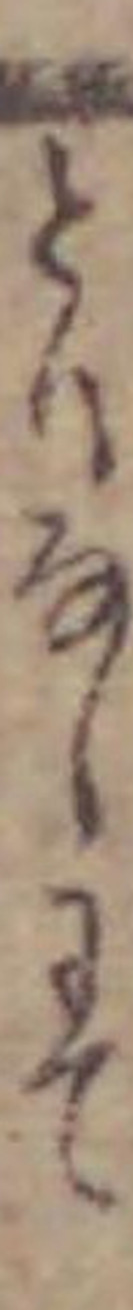とりなしにて
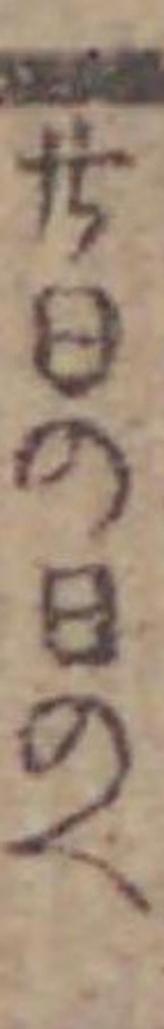廿日の日のへ
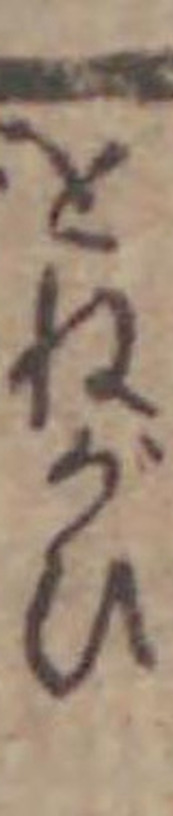をねがひ
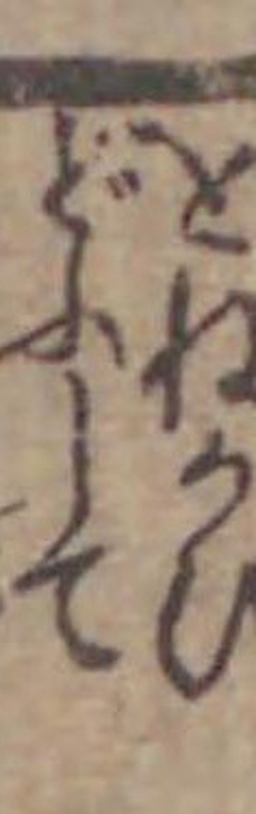どふして
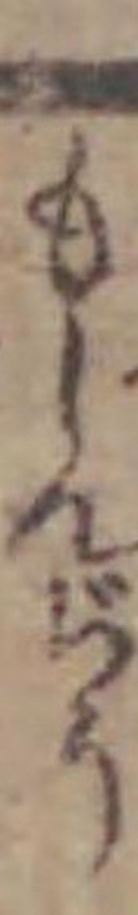おしんぢう
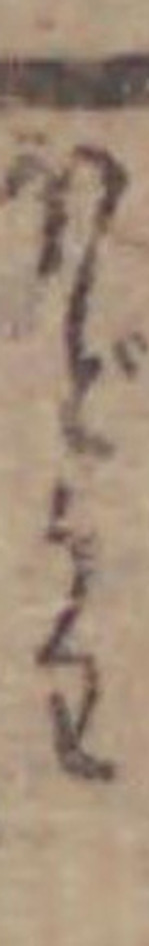ほどうわ
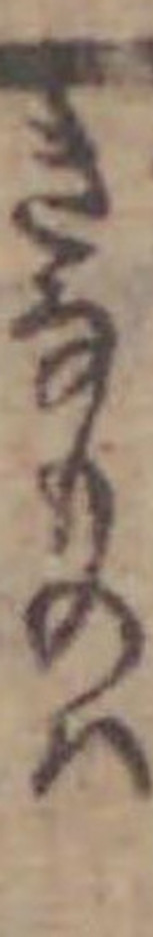きなものは
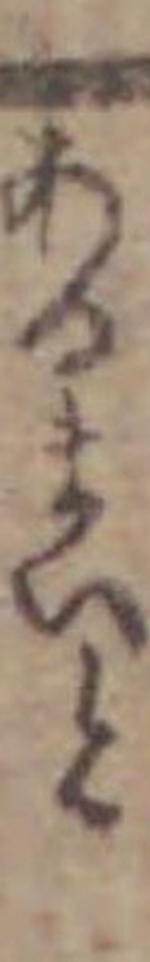あるまいと
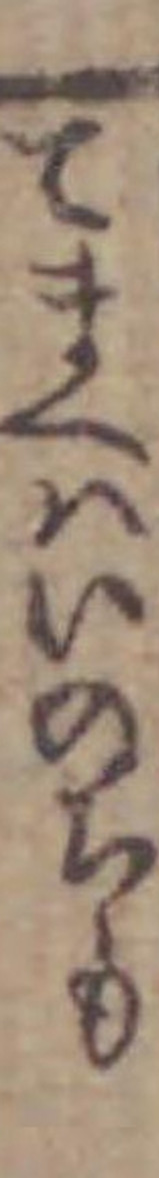てまへはいのちも
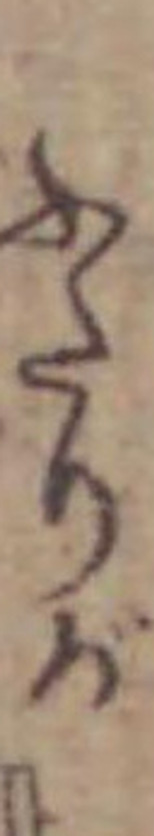ふたりが
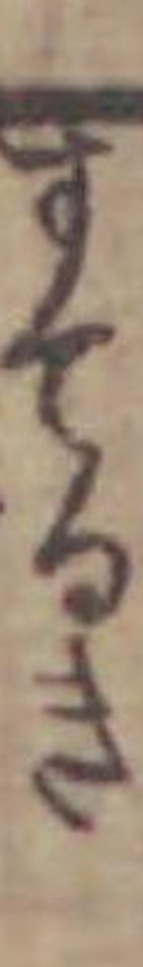すてるき
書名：江戸生艶気樺焼 : 3巻
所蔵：国立国会図書館 National Diet Library, JAPAN
